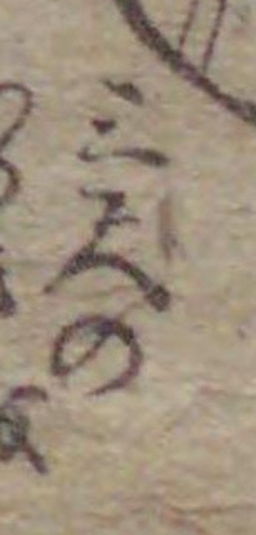三尺の
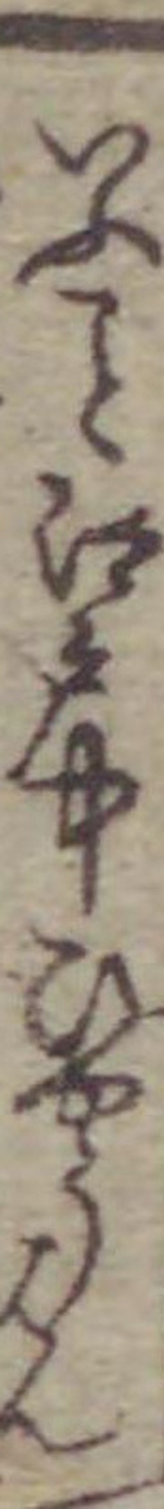いふこと江戸中ひやうはん
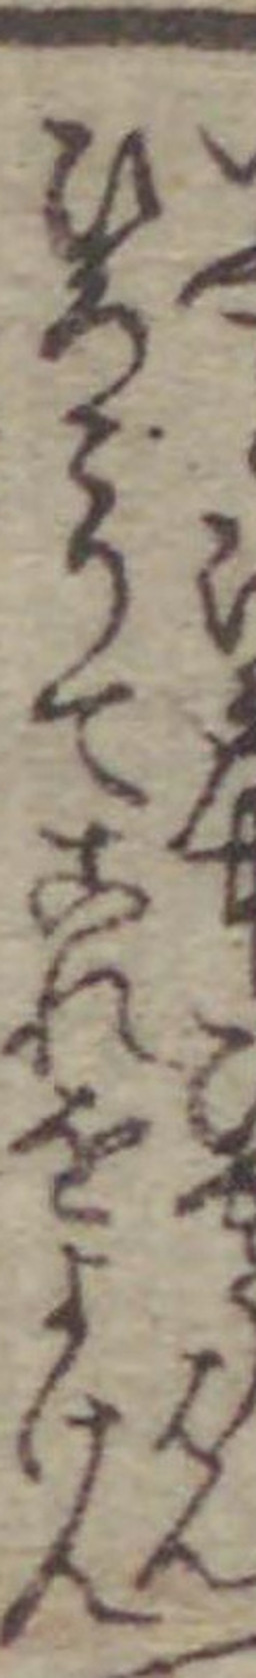ひろごりてこれをよけん
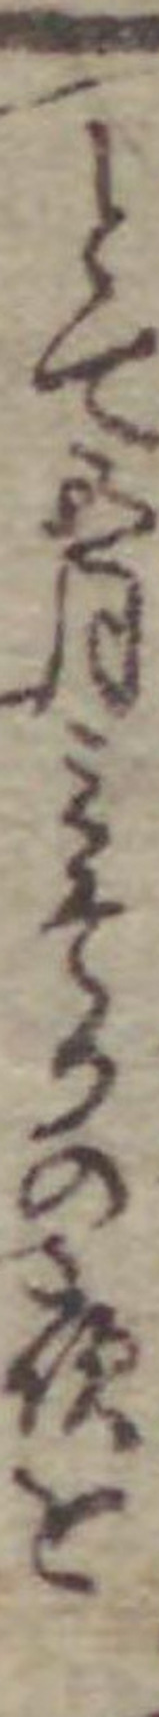とて五月みそかの夜を
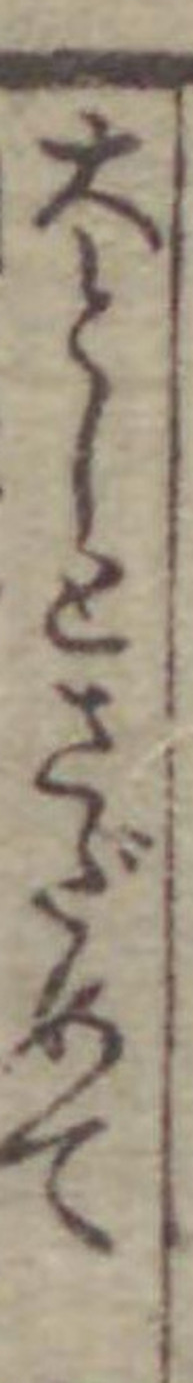大としとさだめて
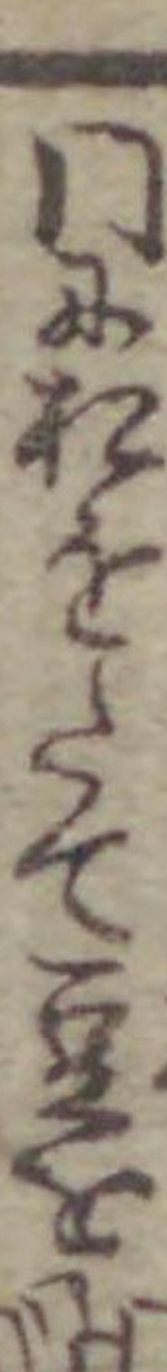門に松をたて豆を
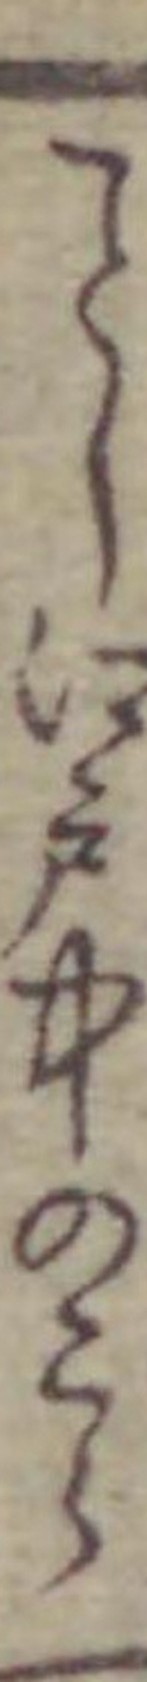ことし江戸中のこら
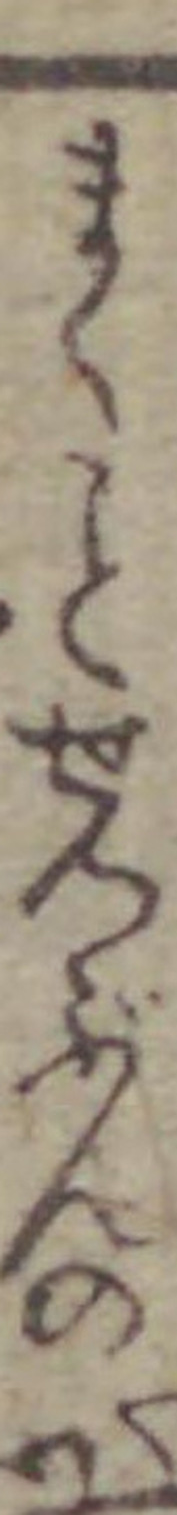まくことせつぶんの
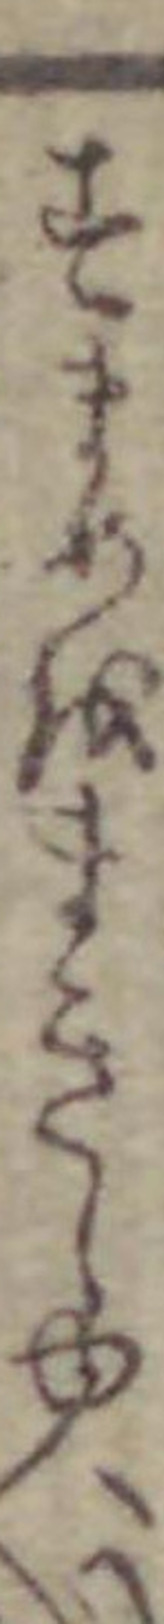すまめをまきしゆへ
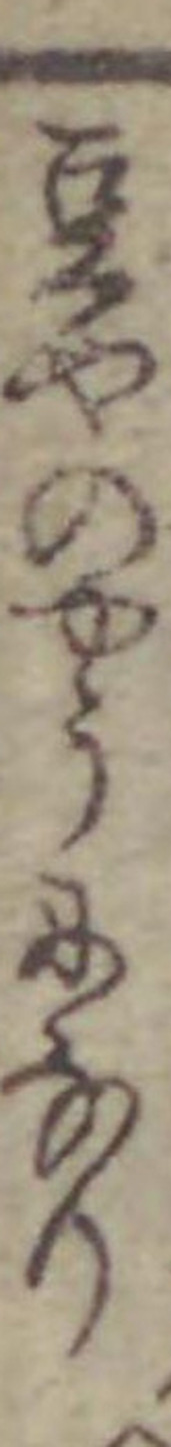豆やのやうになり
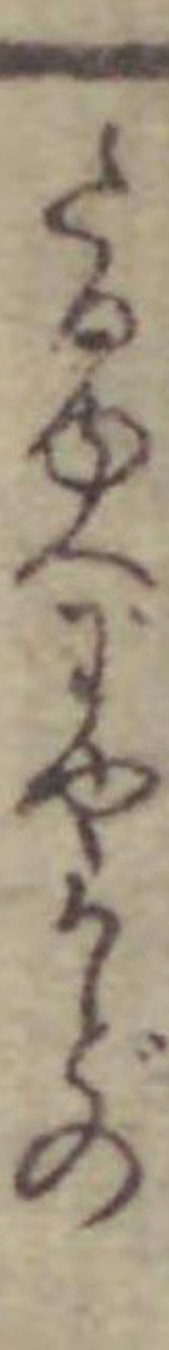たるゆへにやかどの
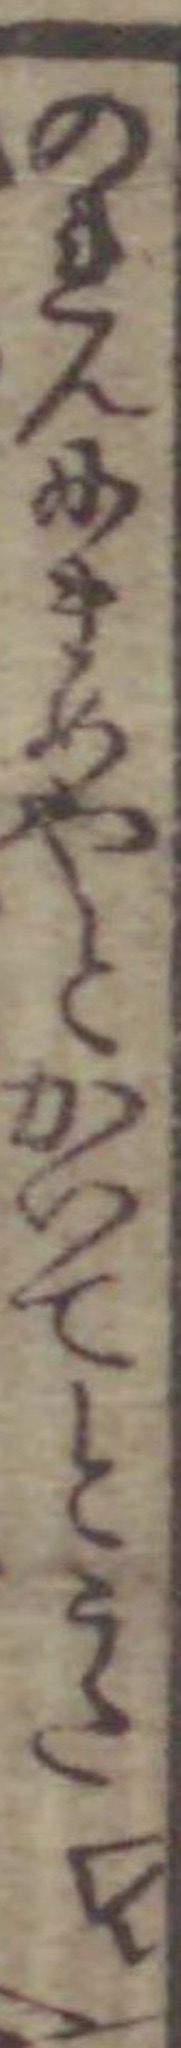のれんにまめやとかいてとうた
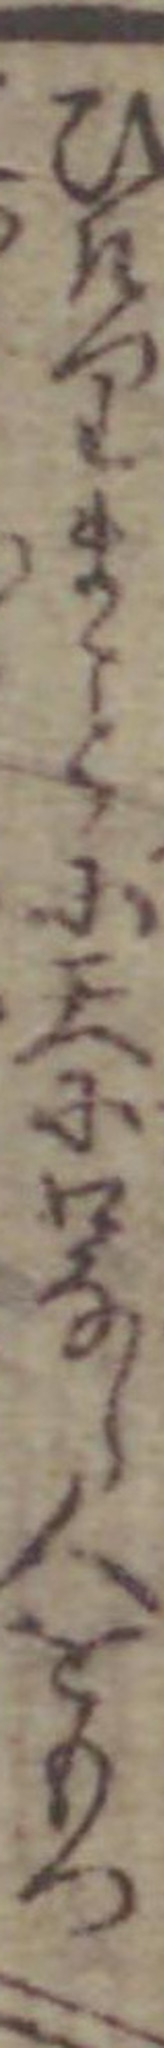ひけりまことに天に口なし人をもつ
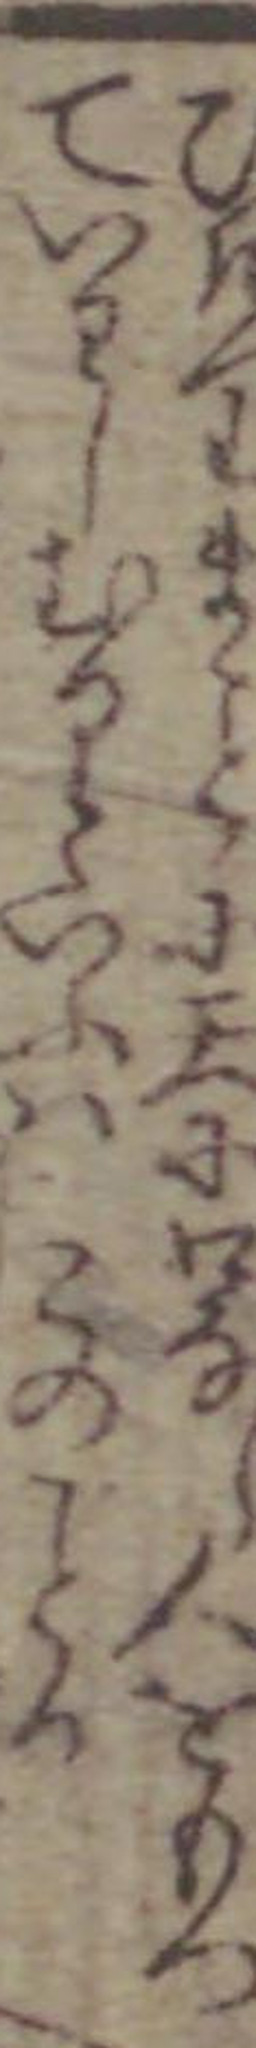ていわしむるといふはこのことか
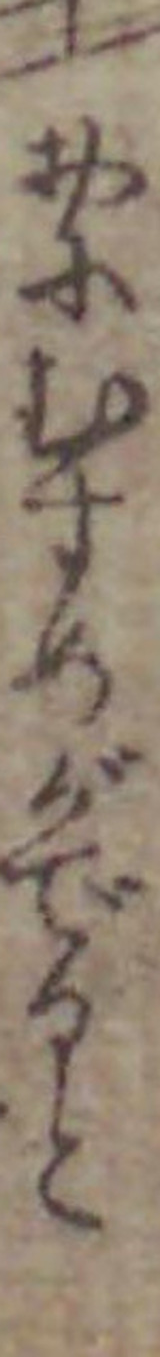おにむすめがでると
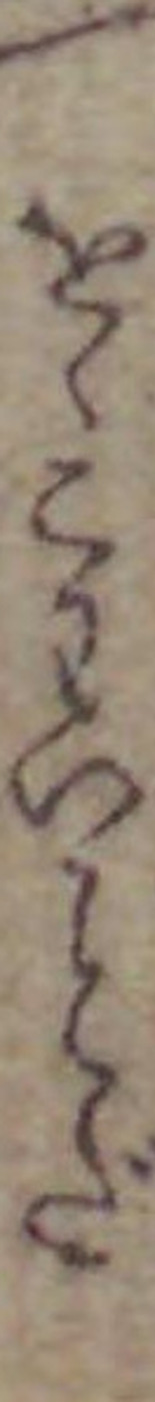をゝこわいことだ
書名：鬼の趣向草 2巻
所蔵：国立国会図書館 National Diet Library, JAPAN
